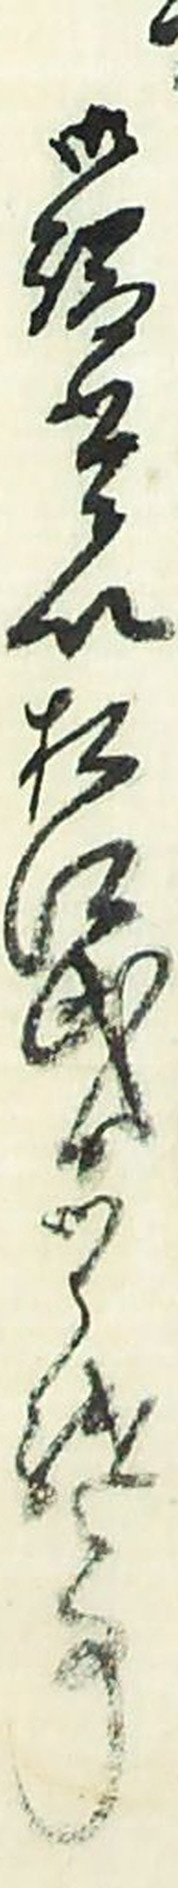御端書ヲ以松江氏ゟ御申継候事
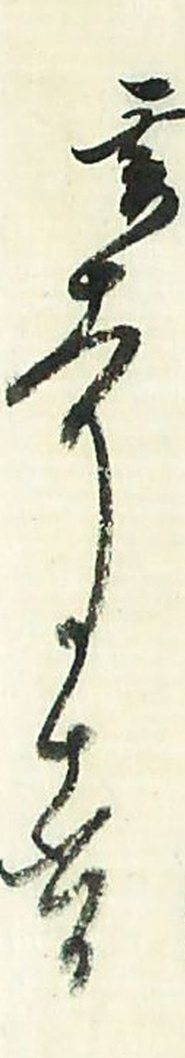亥十一月十六日
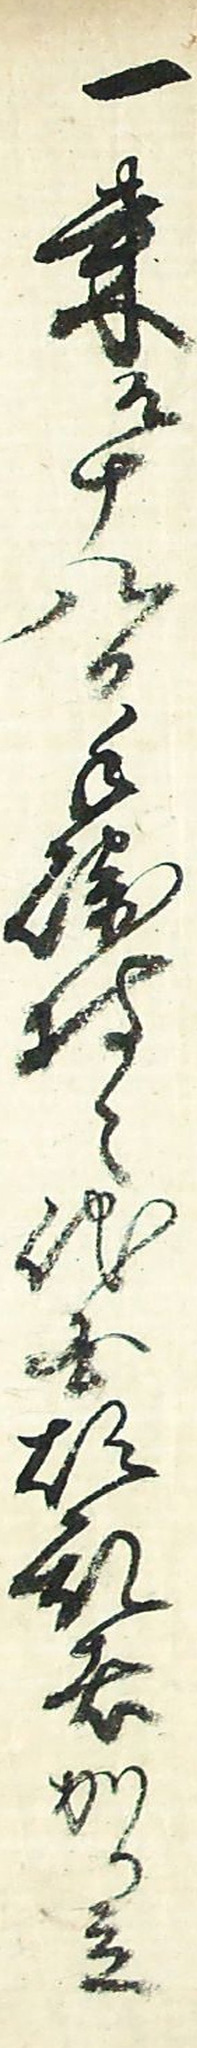一来ル十八日手崎村々他国胡乱者かり立
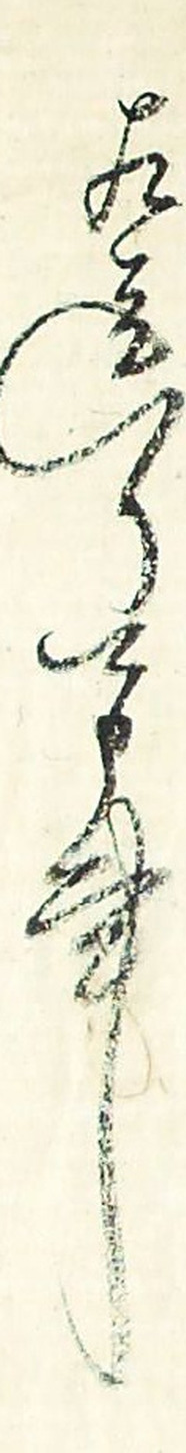相送り可申事
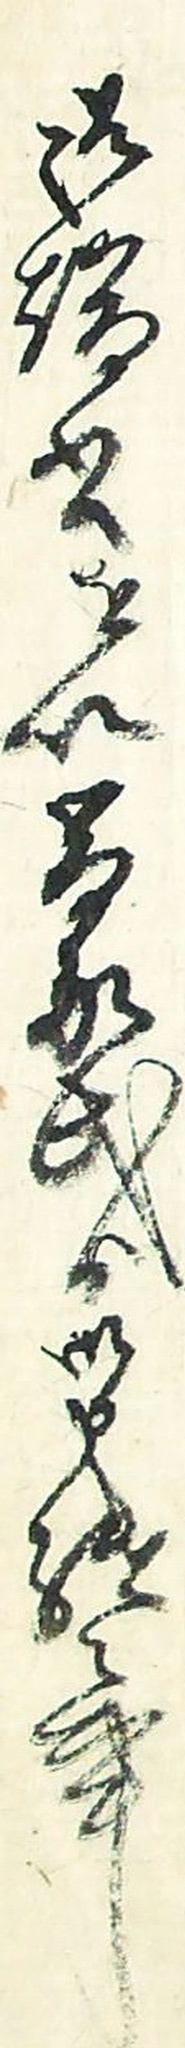御端書を以冨永氏ゟ御申継之事

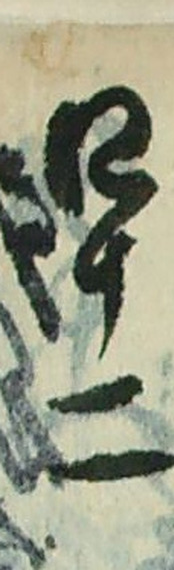四十二

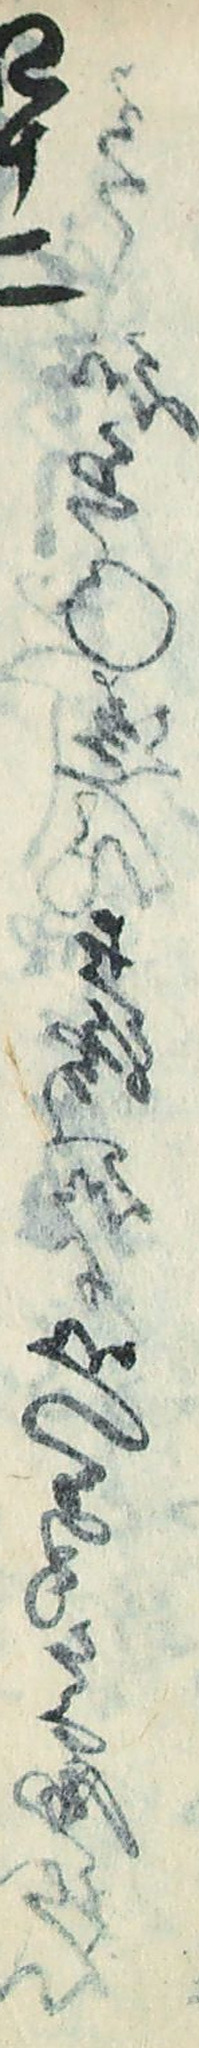十一月廿八日
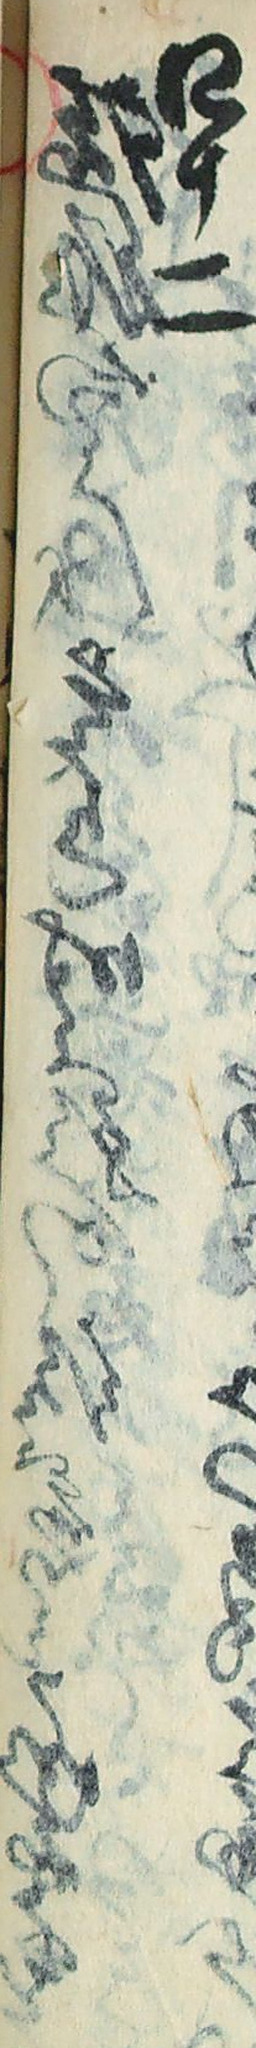十一月廿八日
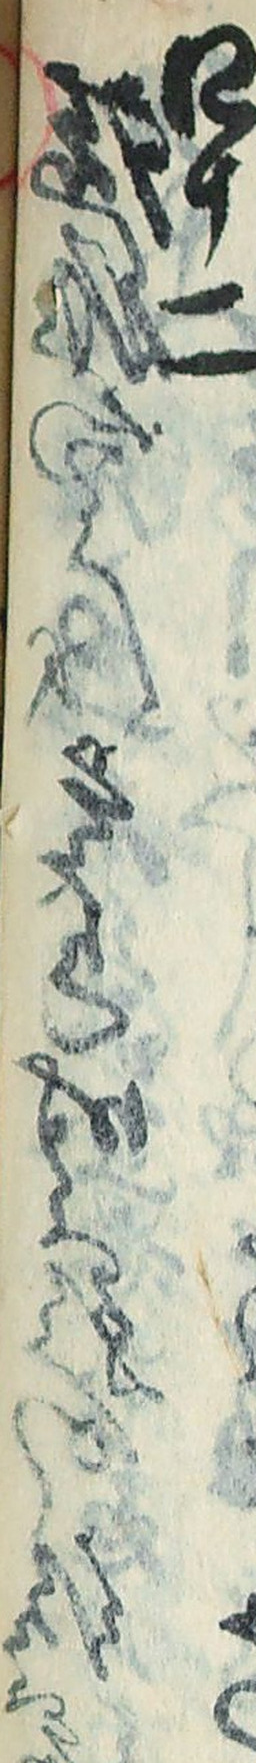十一月廿八日
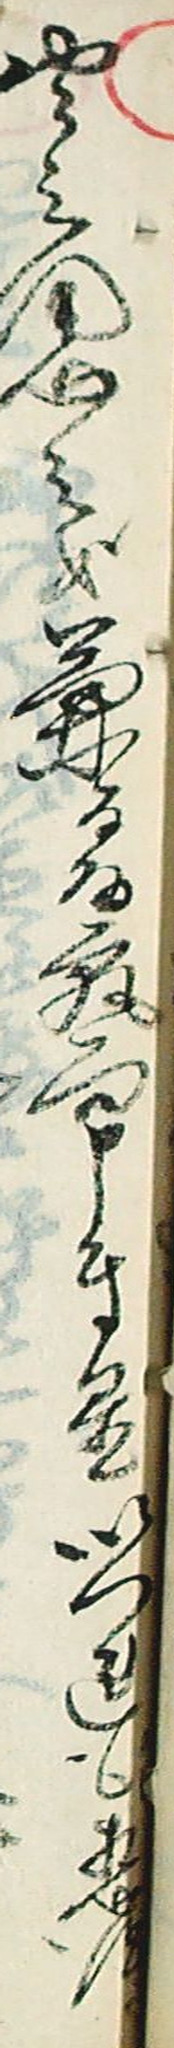火之用心之義兼而取究向申付置いつれも相心得
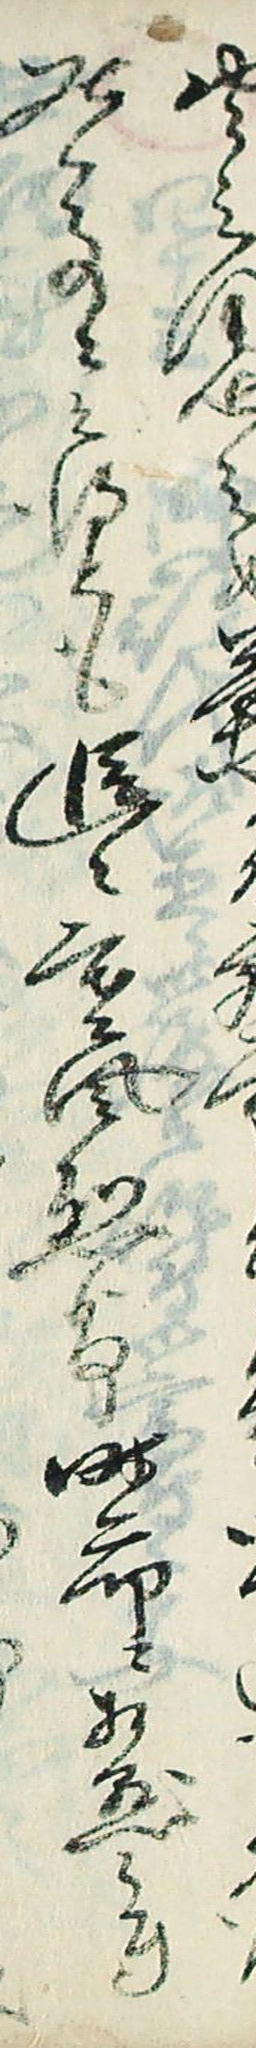居候事ニ候得とも追々寒風烈布時節ニ相懸ニ付
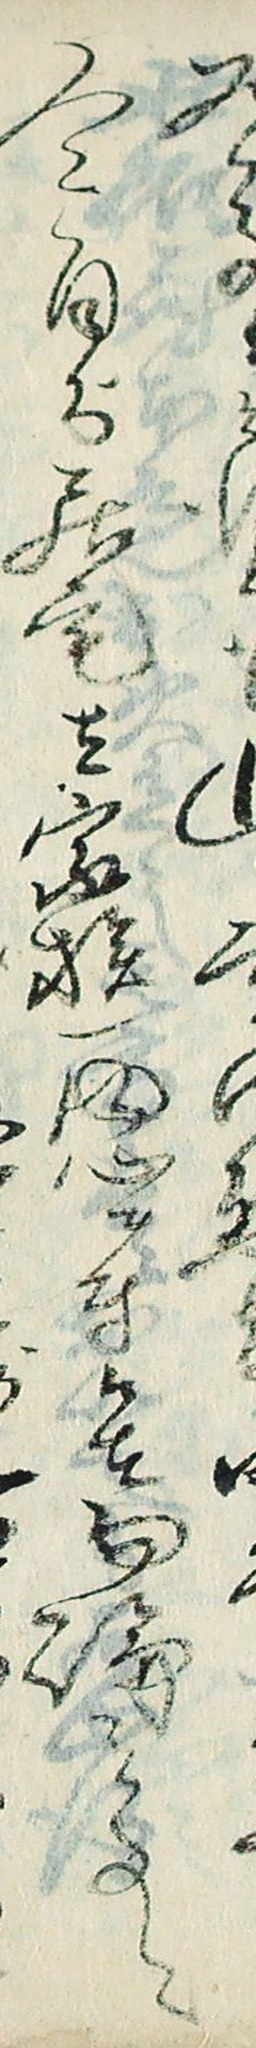人々自分居宅者家族一円心ヲ付候者勿論之事ニ
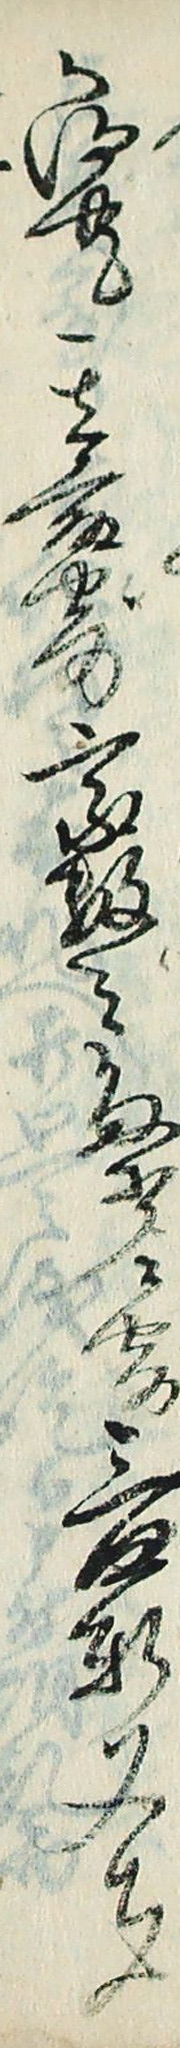候得共其最寄家数之多少ニ寄三四軒又者
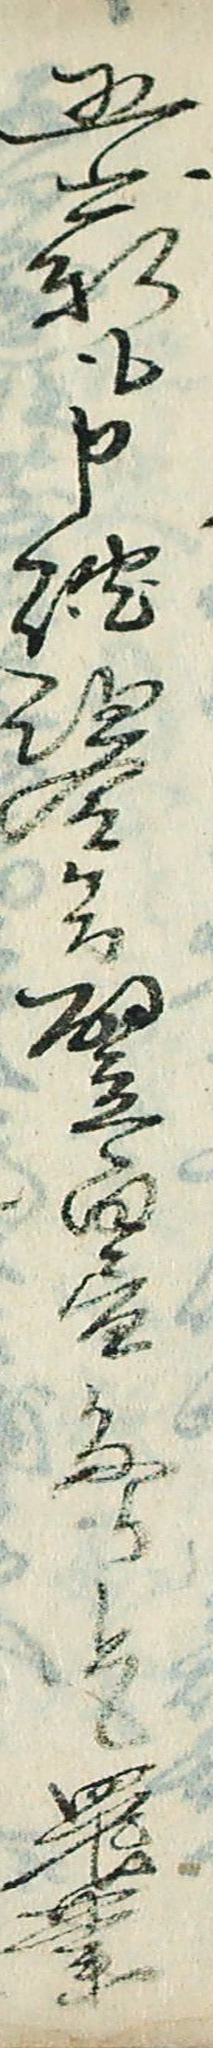五六軒も申談組合候而翌白昼たりとも農業
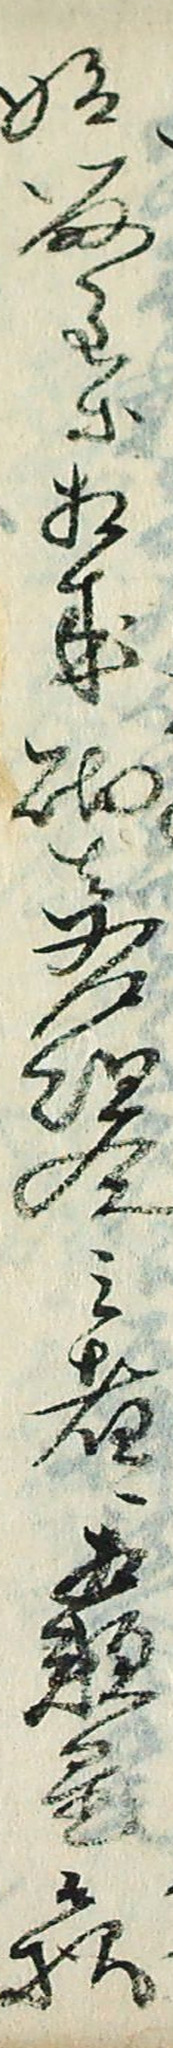始留主等相成砌者右組合之者へ相頼置候様
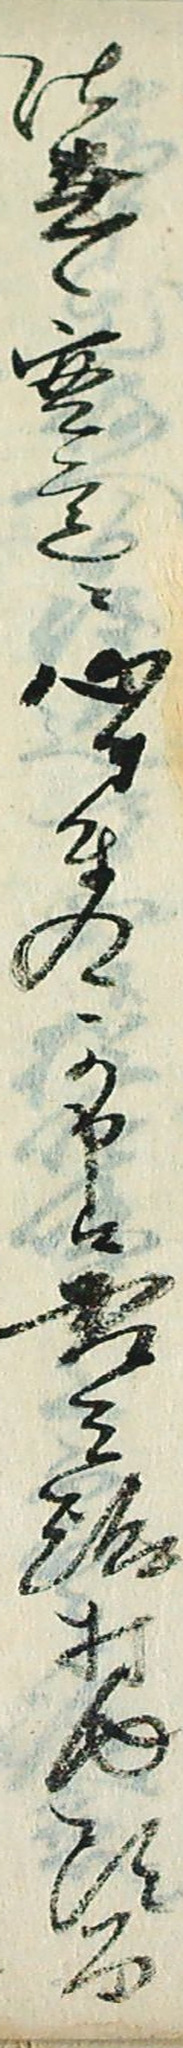仕在候實意ニ心ヲ付合可申候右之趣村内頭百
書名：諸御趣意書并御下知向之写
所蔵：鳴門教育大学 Naruto University of Education
